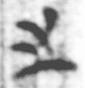之
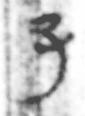子（牸）
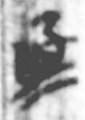爲
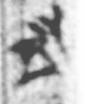○（右）
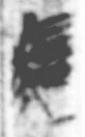驂
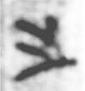之
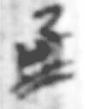爲
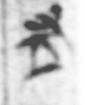○（右）
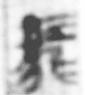飛（騑）
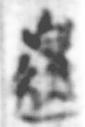邊
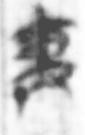輿
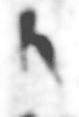人
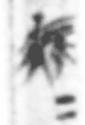六
